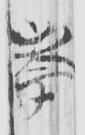考
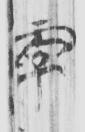{亓子}
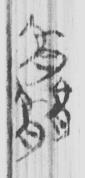{兔兔兔}
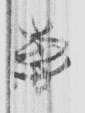惠
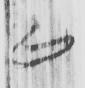㠯（以）
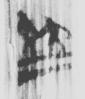並
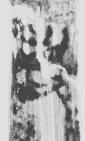事
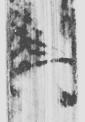之
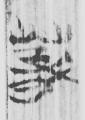春
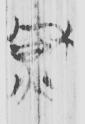{日火禾}
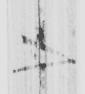之
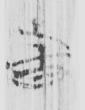{屮日}
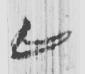㠯（以）
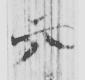亓
